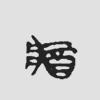將
